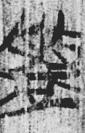盤
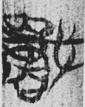○（戰）
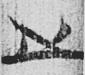之
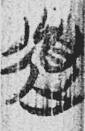道
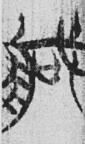戕（莊）
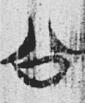公
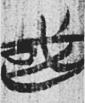或（又）
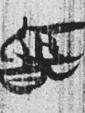䎽（聞）
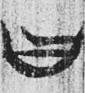曰
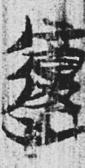○（復）
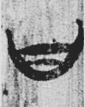甘
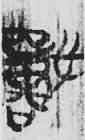○（戰）
